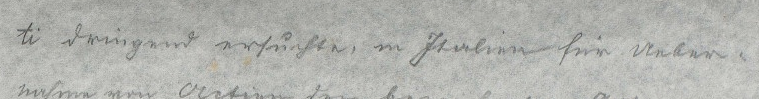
ti dringend ersuchte, in Italien für Ueber-
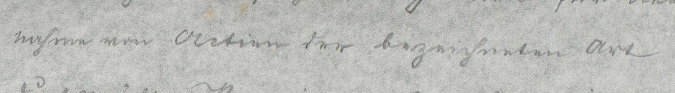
nahme von Actien der bezeichneten Art
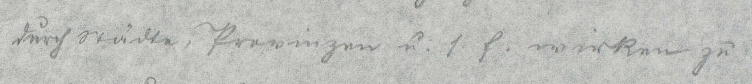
durch Städte, Provinzen u. s. f. wirken zu
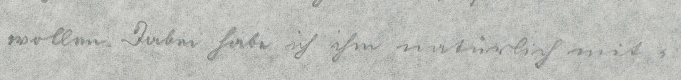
wollen. Dabei habe ich ihm natürlich mit-
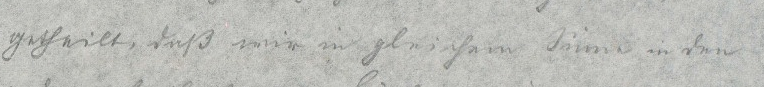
getheilt, daß wir in gleichem Sinne in den
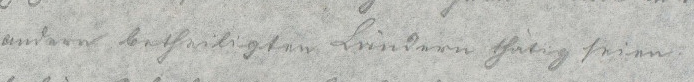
andern betheiligten Ländern thätig seien.
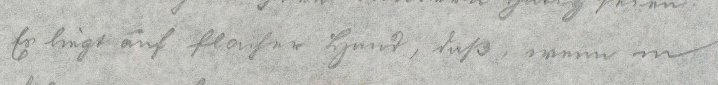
Es liegt auf flacher Hand, daß, wenn in
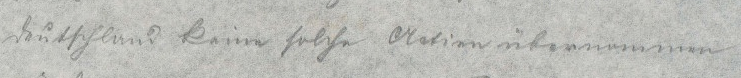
Deutschland keine solche Actien übernommen
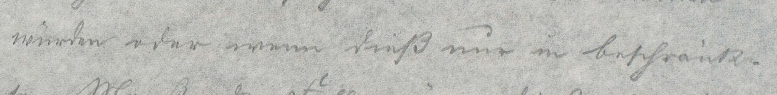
würden oder wenn dieß nur in beschränk-
